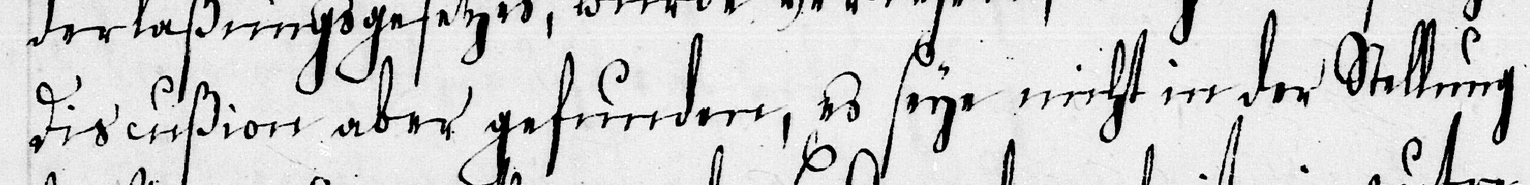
Discußion aber gefunden, es seye nicht in der Stellung
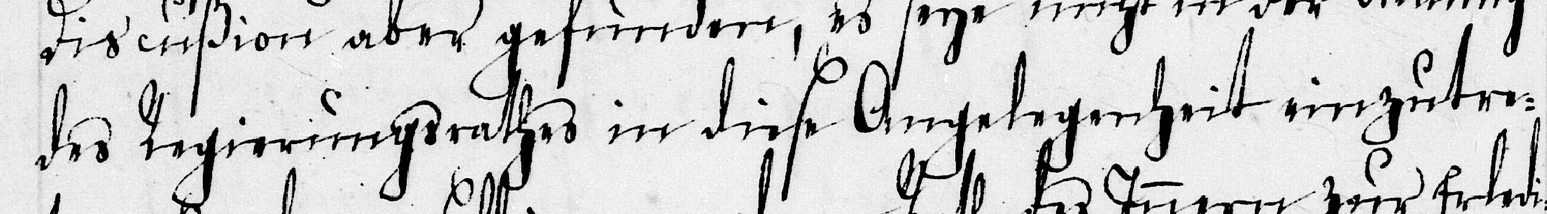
des Regierungsrathes in diese Angelegenheit einzutre¬
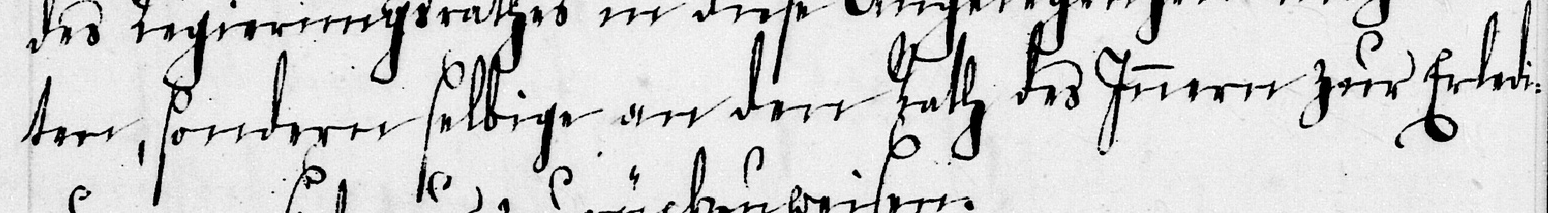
ten, sondern selbige an den Rath des Innern zur Erled¬
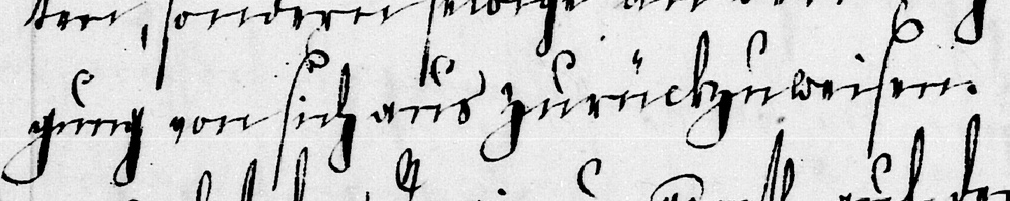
igung von sich aus zurückzuweisen.
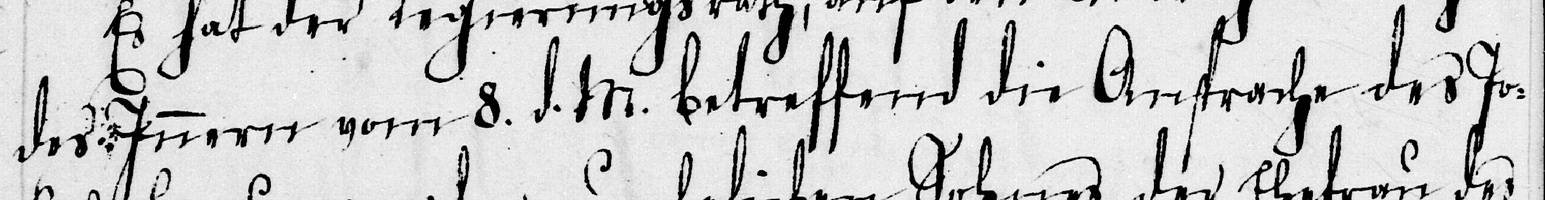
des Innern vom 8. d. M. betreffend die Ansprache des Jo¬
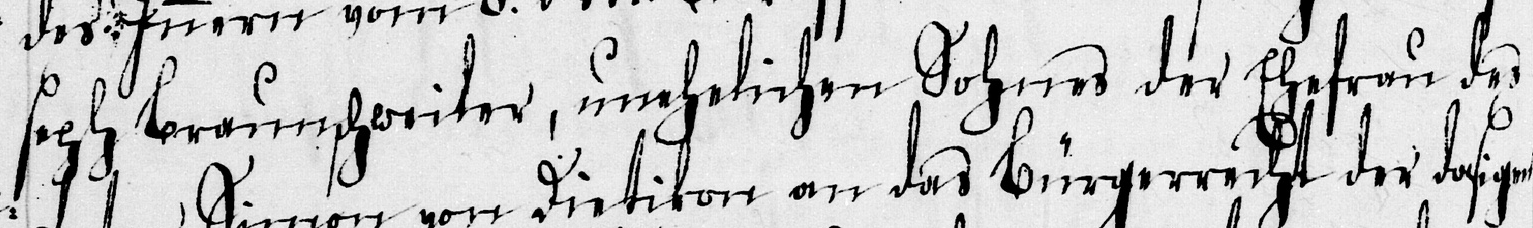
seph Braunschweiler, unehelichen Sohnes der Ehefrau des
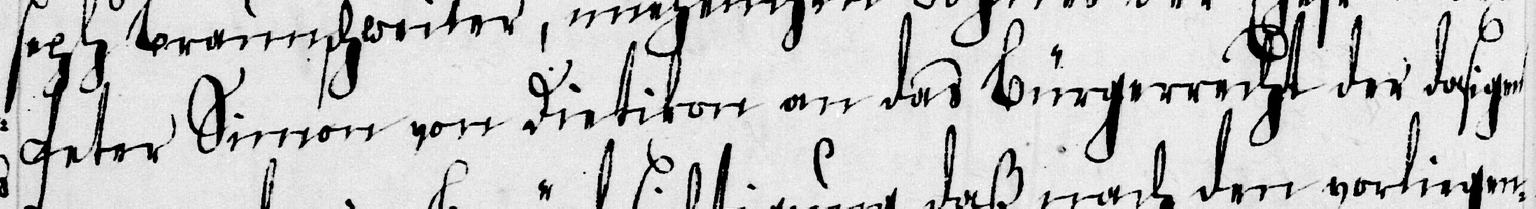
Peter Simon von Dietikon an das Bürgerrecht der dasig¬
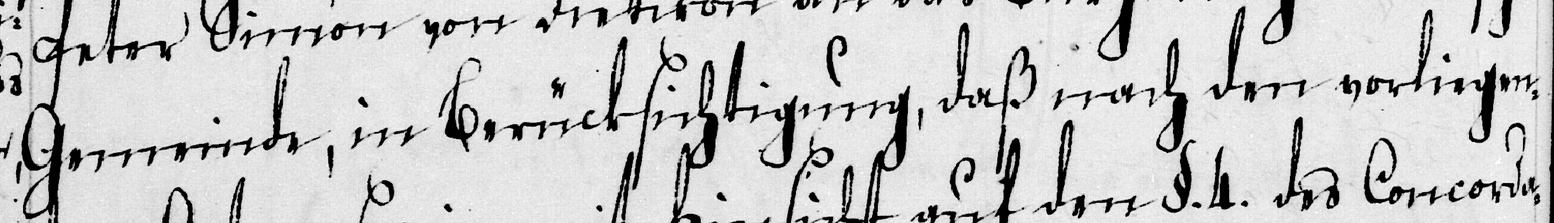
Gemeinde, in Berücksichtigung, daß nach den vorliegen¬
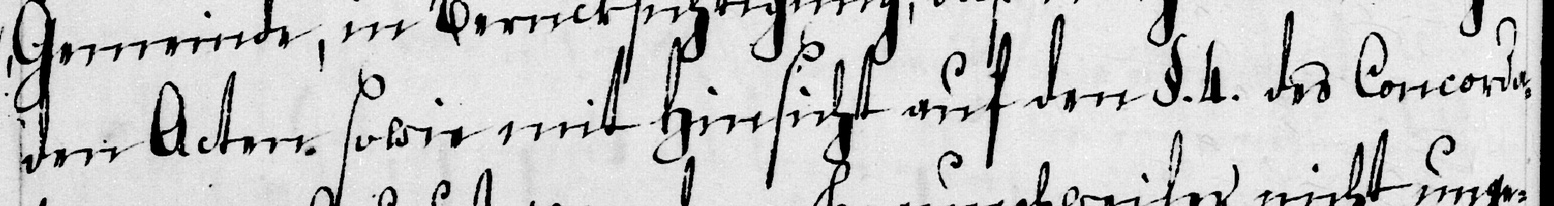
den Acten sowie mit Hinsicht auf den §. 4. des Concorda¬
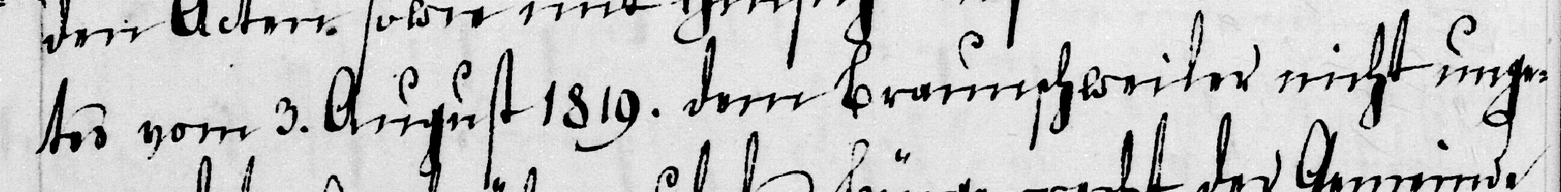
tes vom 3. August 1819. dem Braunschweiler nicht unge¬
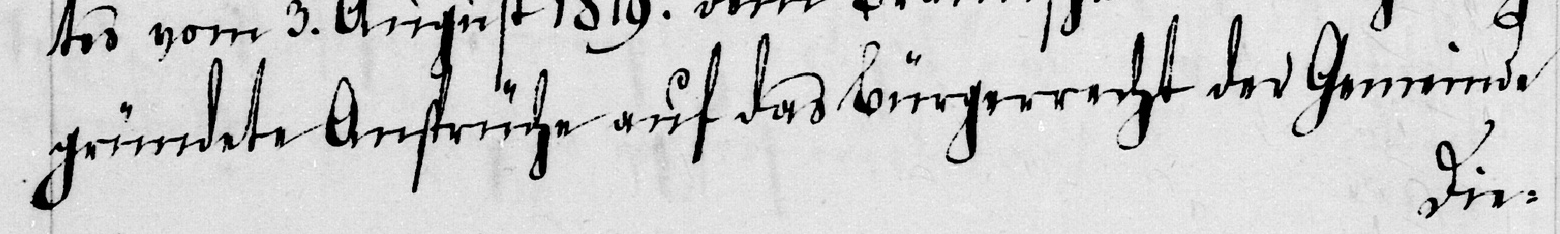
gründete Ansprüche auf das Bürgerrecht der Gemeinde
